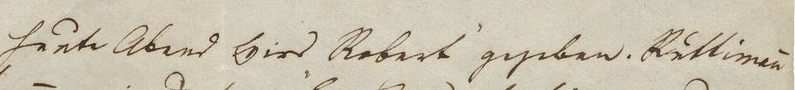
Heute Abend wird «Robert» gegeben. Rüttimann
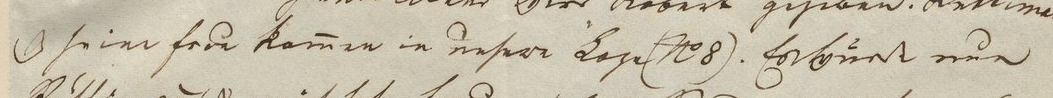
& seine Frau kommen in unsere Loge (No 8.). Es würde nun
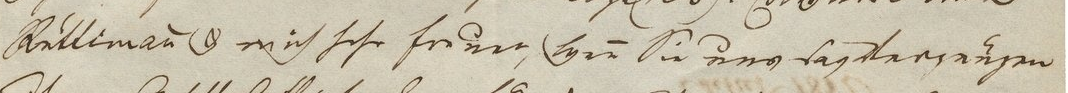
Rüttimann & mich sehr freuen, wenn Sie uns das Vergnügen
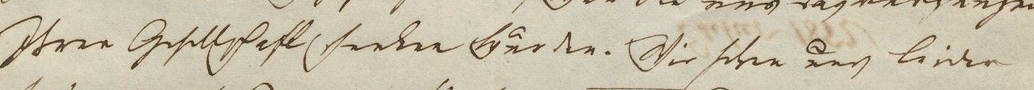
Ihrer Gesellschaft schenken würden. Wir sehen uns leider
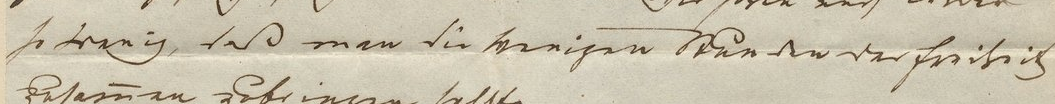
so wenig, daß man die wenigen Stunden der Freiheit
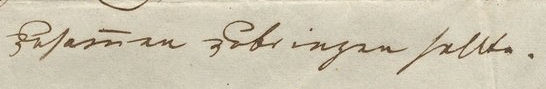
zusammen zubringen sollte.
